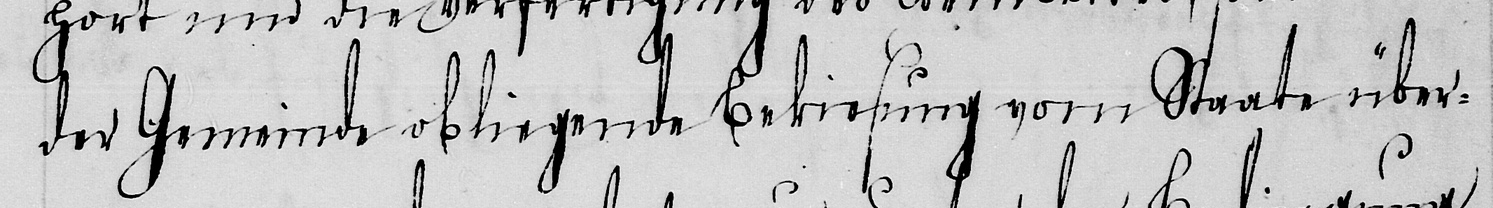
der Gemeinde obliegende Bekiesung vom Staate über¬
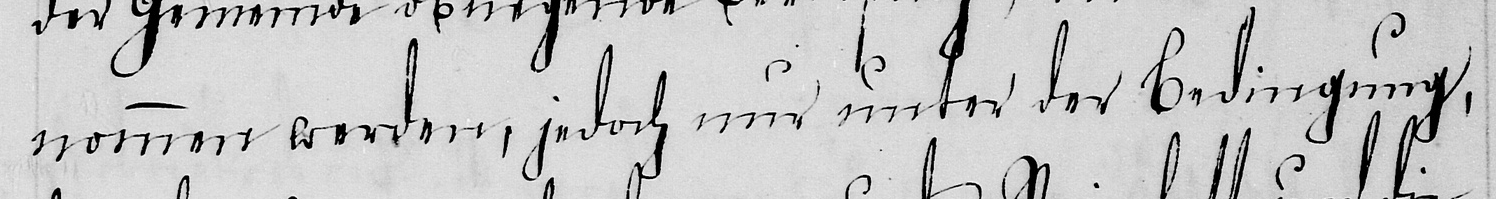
nommen werden, jedoch nur unter der Bedingung,
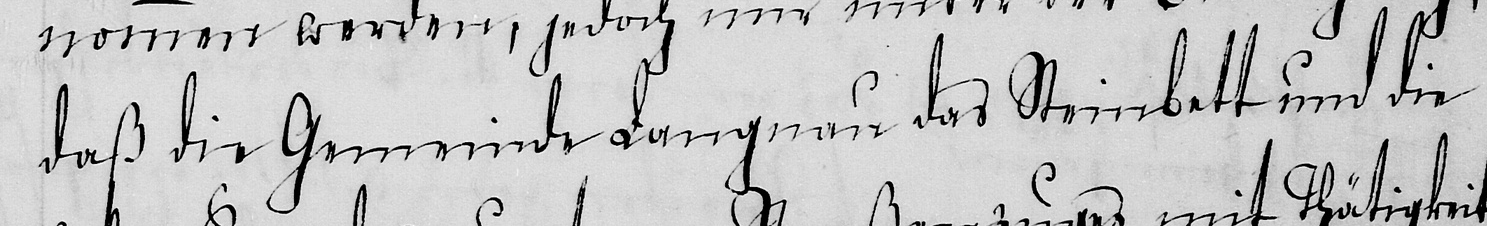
daß die Gemeinde Langnau das Steinbett und die
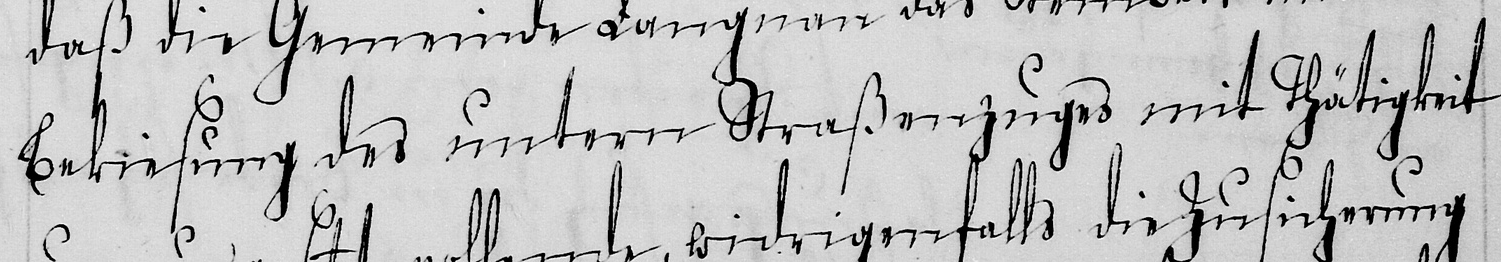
Bekiesung des untern Straßenzuges mit Thätigkeit
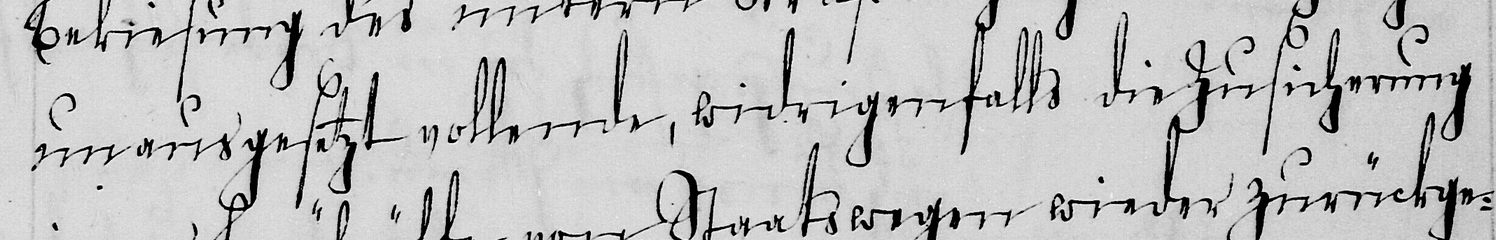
unausgesetzt vollende, widrigenfalls die Zusicherung
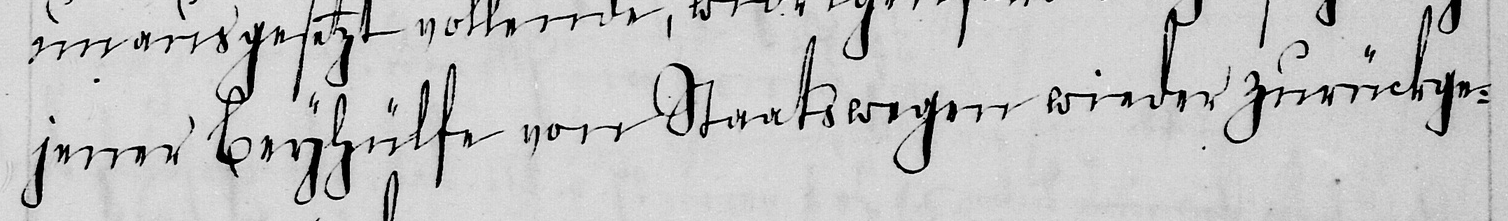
jener Beyhülfe von Staatswegen wieder zurückge¬
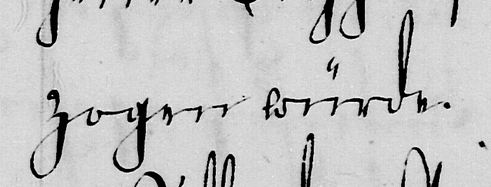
zogen würde.
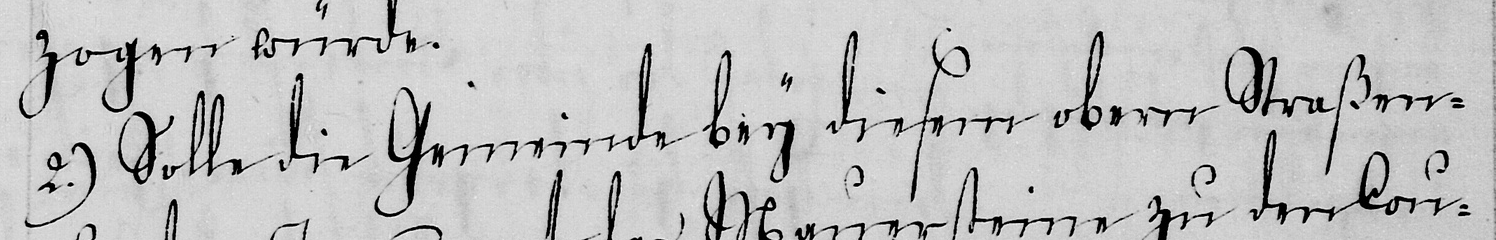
2.) Solle die Gemeinde bey diesem obern Straßen¬
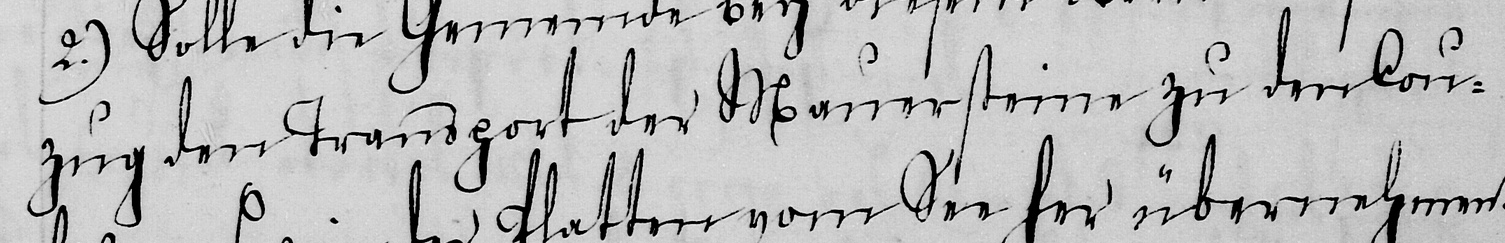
zug den Transport der Mauersteine zu den Cou¬
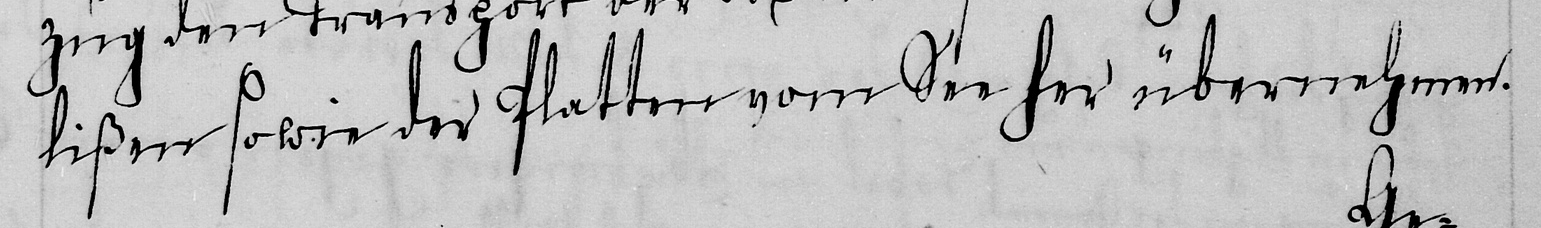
lißen sowie der Platten vom See her übernehmen.
